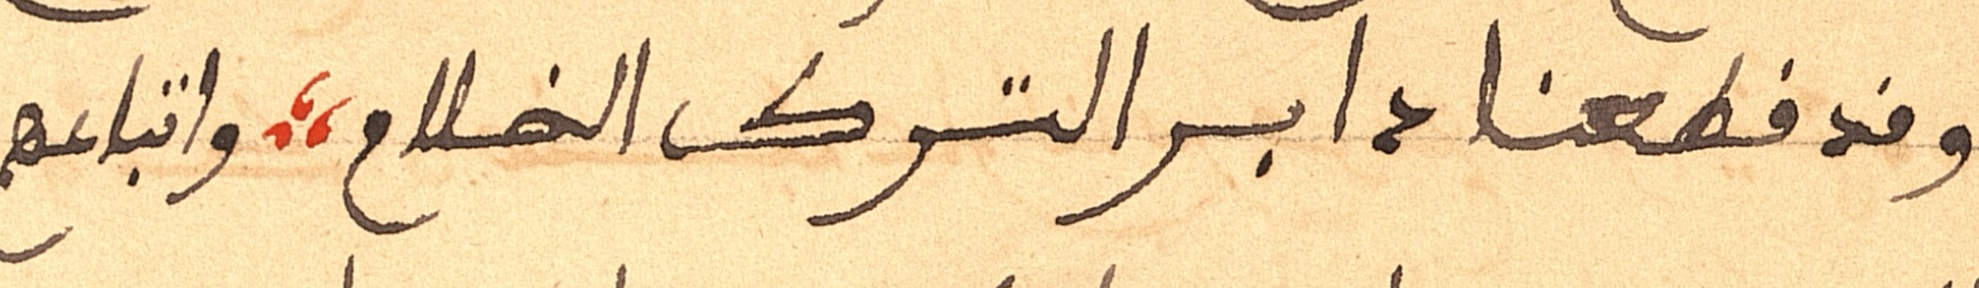وقد قطعنا دابر الترك الضلام اتباعهم
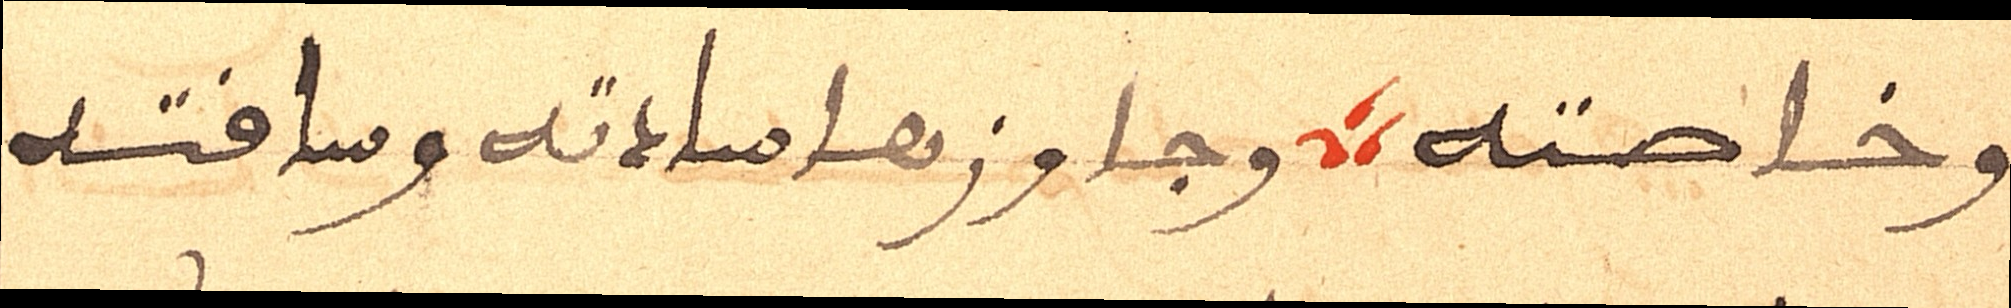وخاصته وجاوزها سادته وساقته
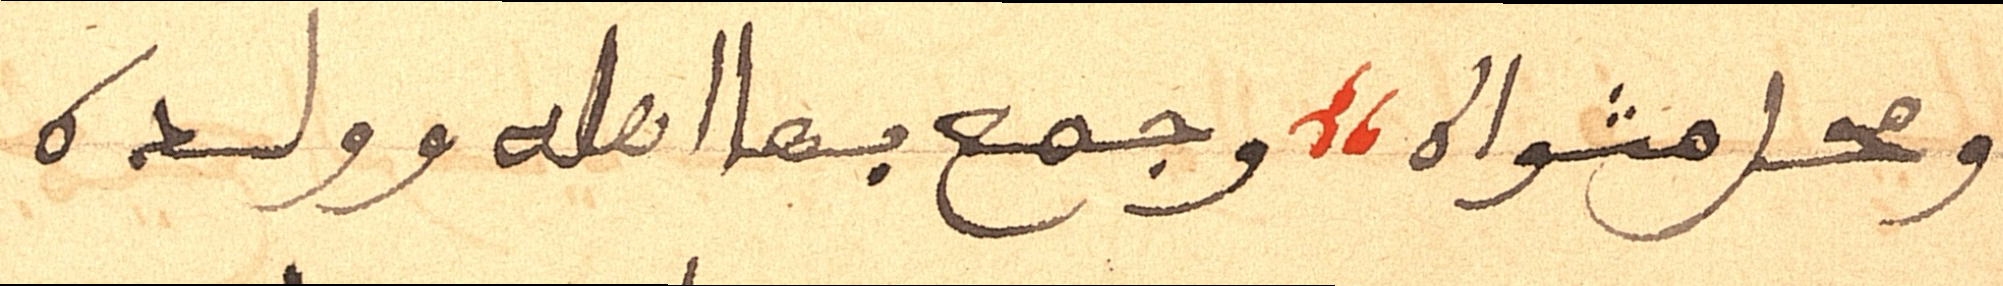ومحل مثواه وجمع بها اهله وولده
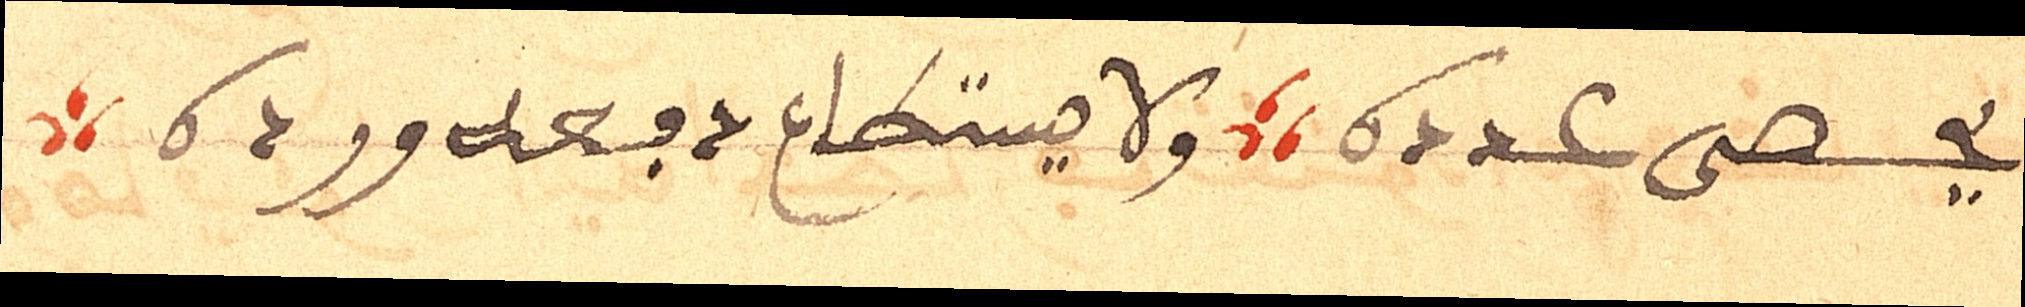يحصي عدده ولا يسطاع دفعه ورده
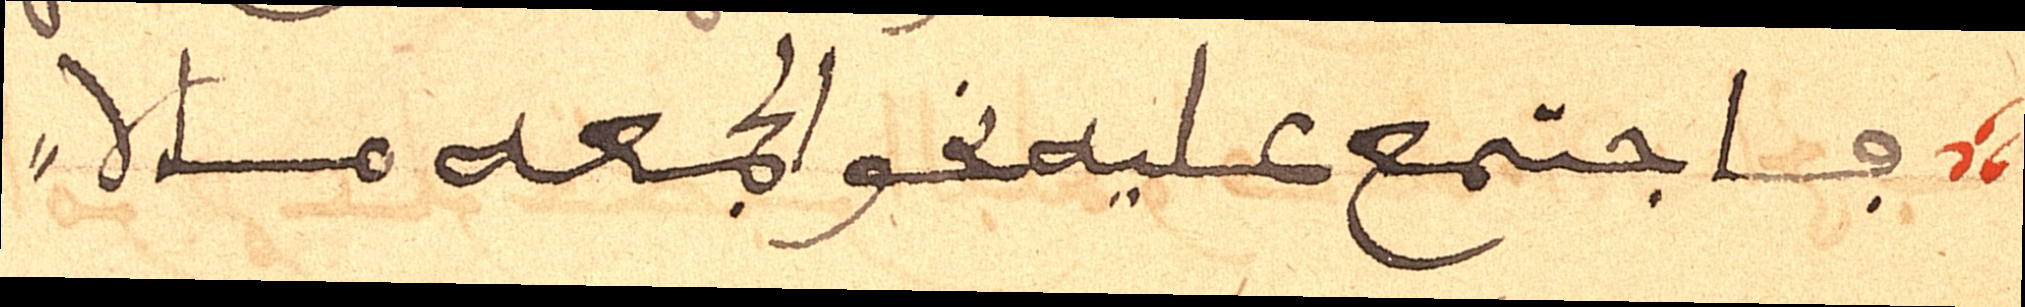فاجتمع عليه نحو الجمعه مالا
